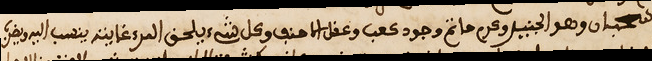سحبان وهو الجنيد وكرم حاتم وجود كعب وعقل الاحنف وكل شىء يلحق المرء غايته ينسب اليه ويضرب
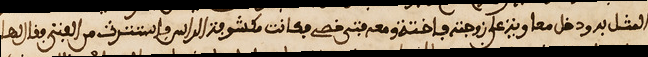المثل به ودخل معاوية على زوجته فاختة ومعه فتى خصى فكانت مكشوفة الراس فاستترت من الفتى فقال لها
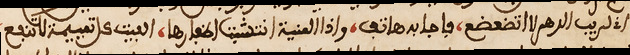انى لريب الدهر لا اتضعضع فاجابه هاتف واذا المنية انتشبت اظفارها الفيت كل تميمة لا تنفع
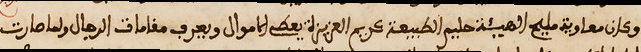وكان معاوية مليح الهيئة حليم الطبيعة كريم العزيزة يعطى الاموال ويعرف مقامات الرجال ولما صارت
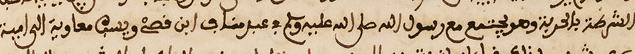الشرطة بالحربة وهو يجتمع مع رسول الله صلى الله عليه وسلم في عبد مناف ابن قصى وينسب معاوية الى امية
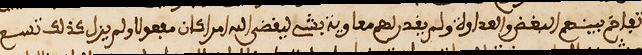تفاقم بينهم البغض والعداوة ولم يقدر لهم معاوية بشى ليقضى الله امرا كان مفعولا ولم يزل كذلك تسع
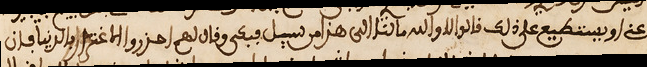عنى او يستطيع على ذلك قالوا لا والله ما لنا الى هذا من سبيل فبكى وقال لهم احذروا الاغترار بالدنيا فان
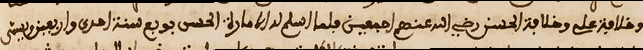وخلافة على وخلافة الحسن رضي الله عنهم اجمعين فلما اسلم له الامارة الحسن بويع سنة احدى واربعين ويسمى
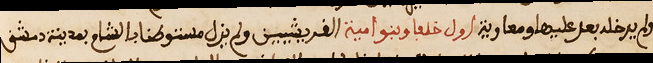ولم يدخله بعد عليها ومعاوية اول خلفا وبنو امية القريشيين ولم يزل مستوطنا بالشام بمدينة دمشق
